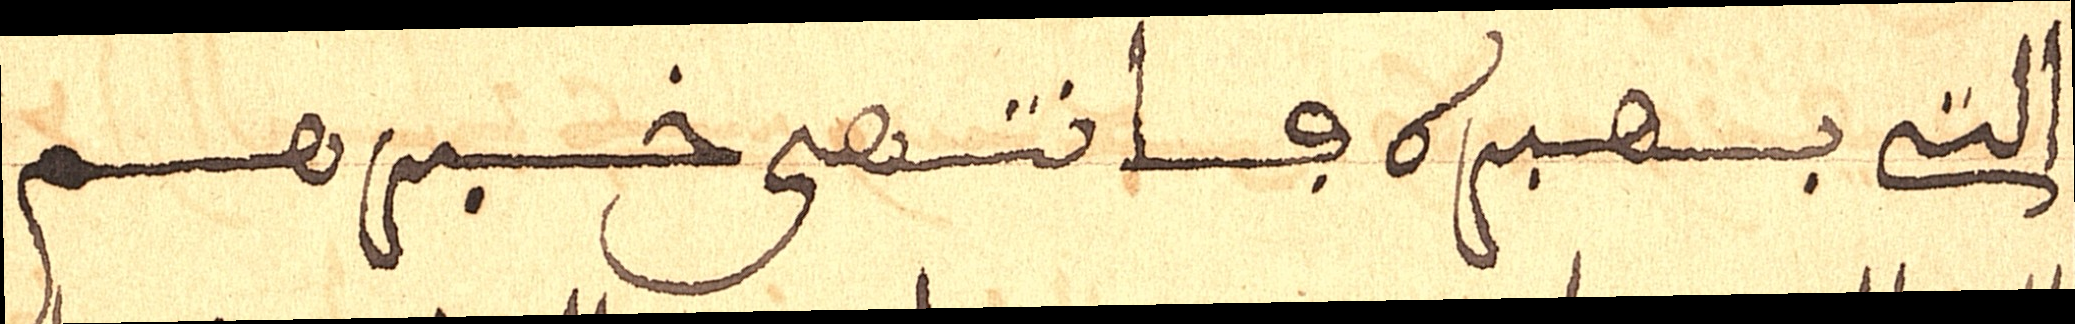التي بهبره فانتهى خبرهم
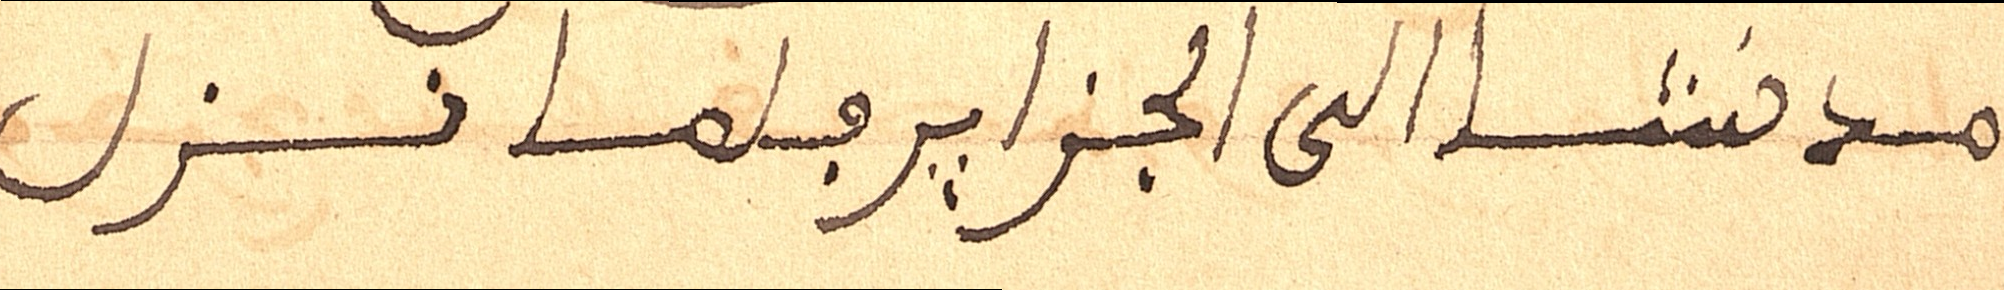مدنشا الى الجزائر فلما نزل
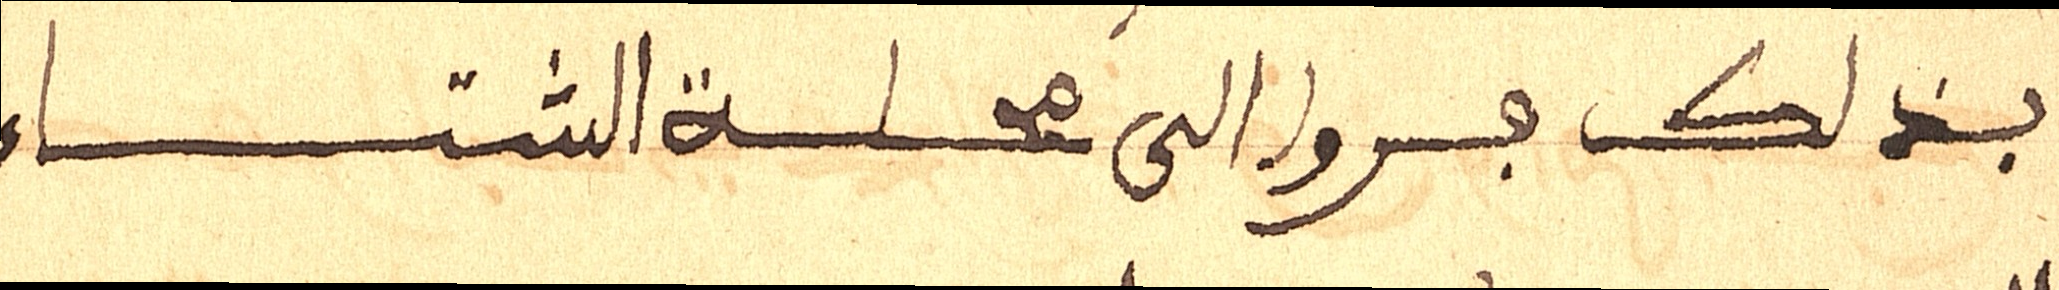بذلك فروا الى محلة الشتاء
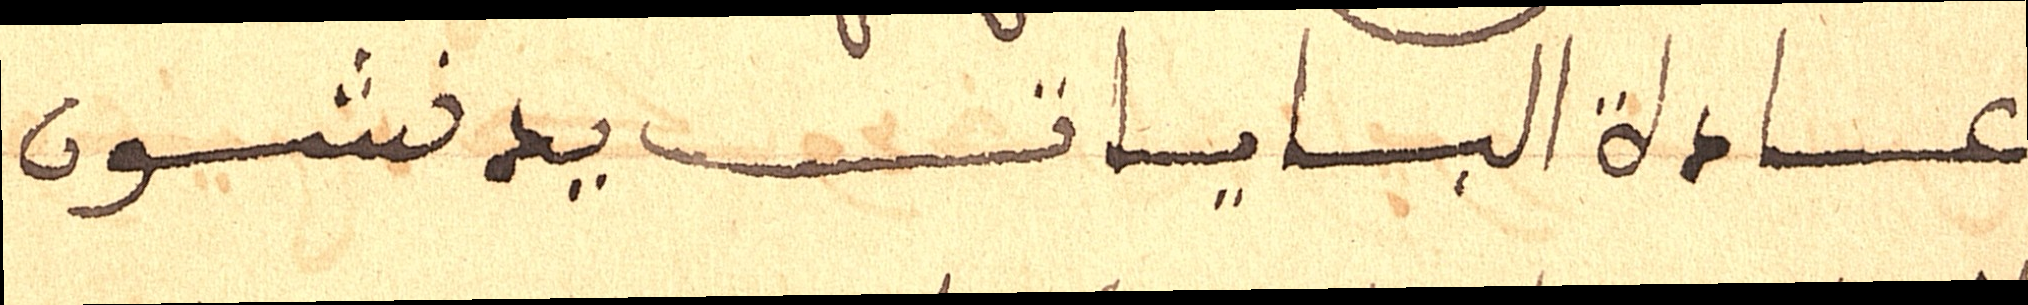عادة البايات يدنشون
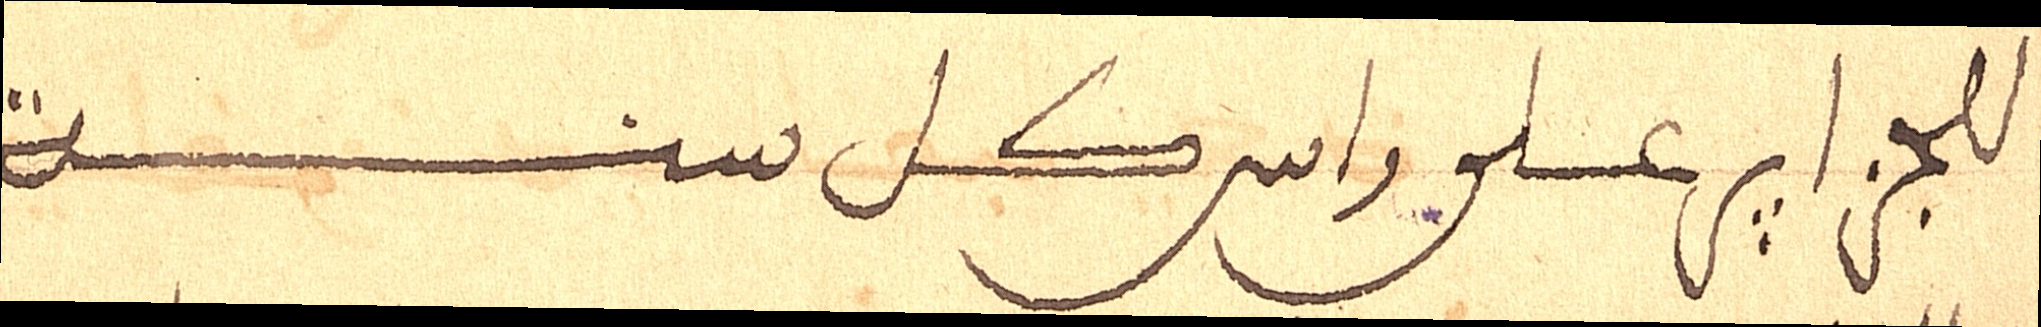للجزائر على راس كل سنة
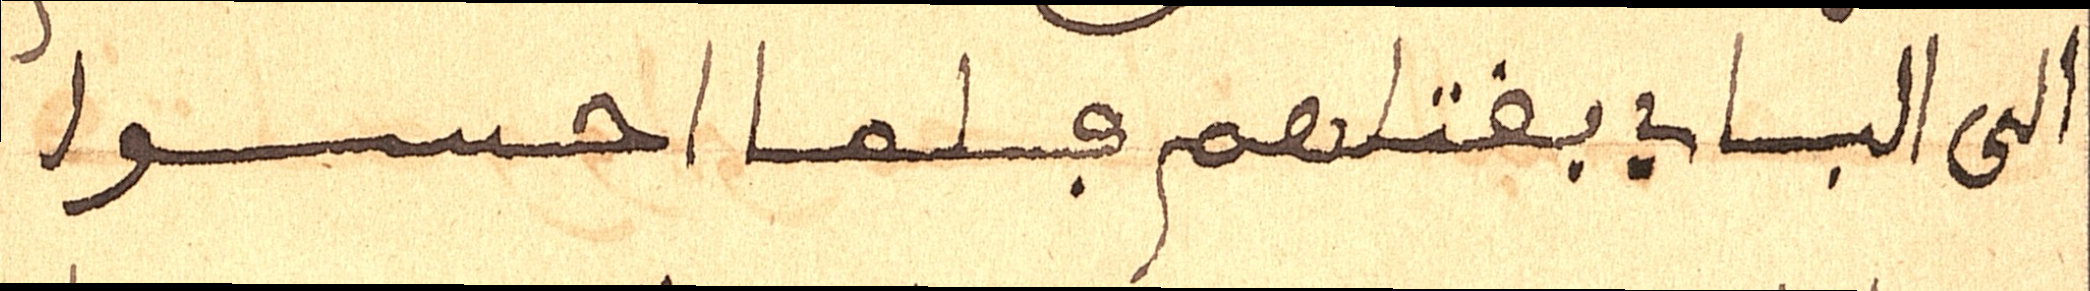الى الباي بقتلهم فلما احسوا
